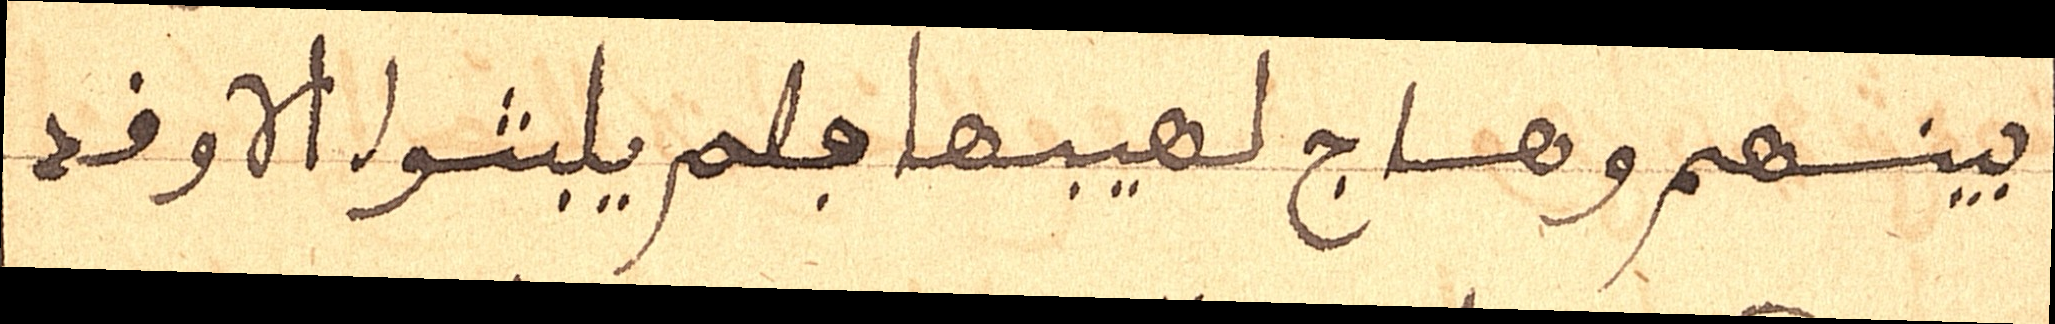بينهم وهاج لهيبها فلم يلبثوا الا وقد
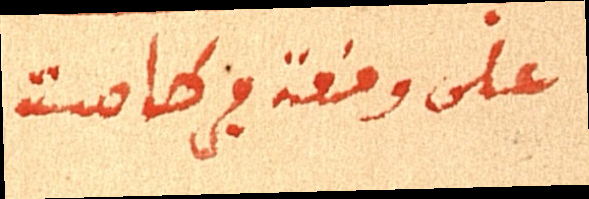على وقعة فرطاسة
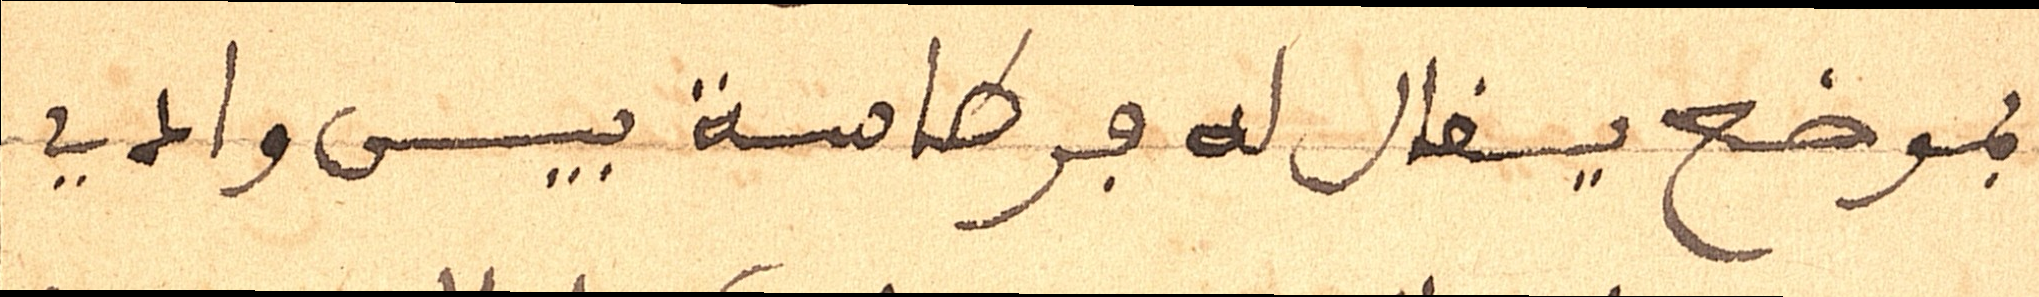بموضع يقال له فرطاسة بين وادي
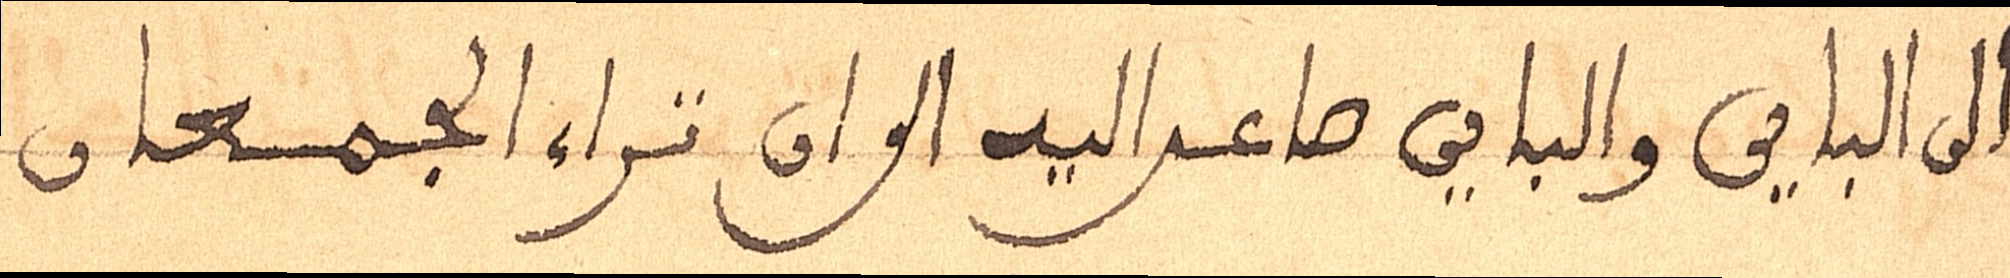الى الباين والباين صاعر اليه الى ان تراء الجمعان
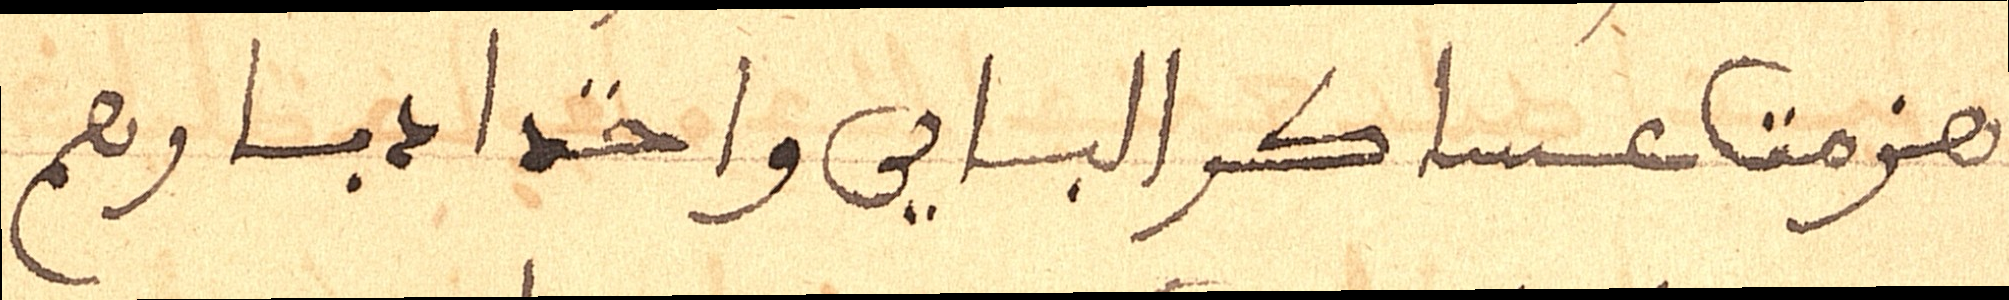هزمت عساكر الباين واحدا دبارهم
